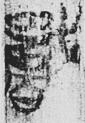○（戰）
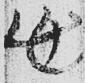心
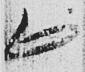㠯
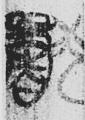獸（守）
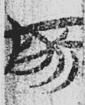所
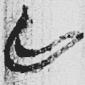㠯
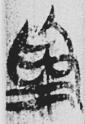爲
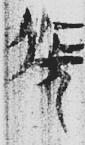倀（長）
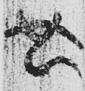也
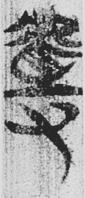○（且）
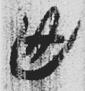臣
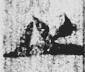之
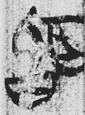○（聞）
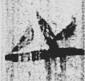之
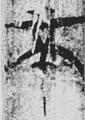不
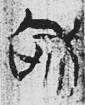和
